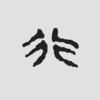行
